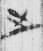之
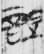○（屬）
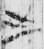之
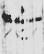左
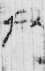尹
